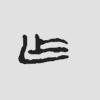乍
